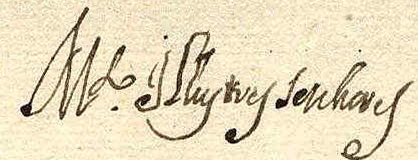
M.to Illustres senhores
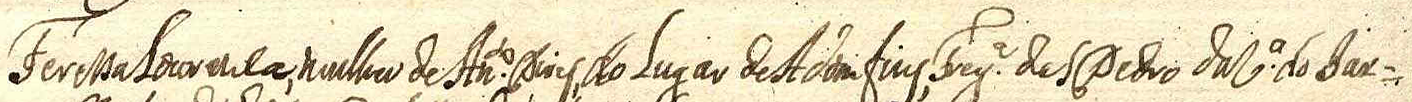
Feressa Lourenca, mulher de An.to Pires, do Lugar de Adomfins, Freg.a de S Pedro da V.a do Iar
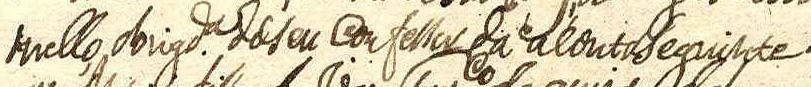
mello, obrigd.a do seu Confessor da a conta seguinte.
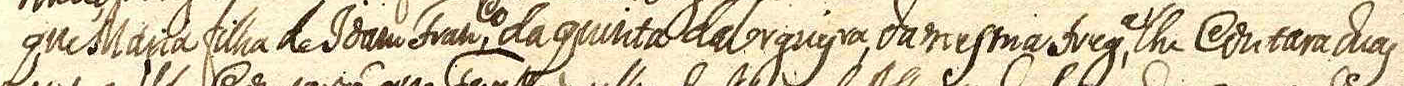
que Maria filha de Ioam Fran,co da quinta da Urguejra, da mesma Freg,a lhe Contara duas
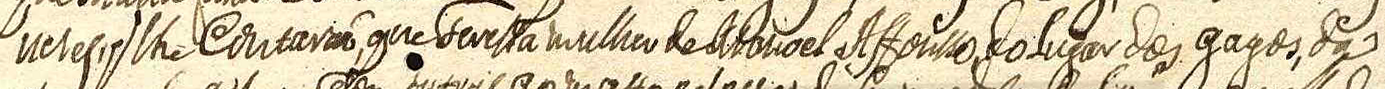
uezes, q̄ lhe Contaraõ, que Feressa mulher de Manoel Affonsso do Lugar dos gagos, da
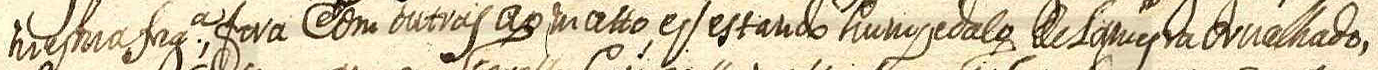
mesma freg.a, fora Com outras ao matto, e q̄ estando hum pedaÇo de Lamejra orualhado,
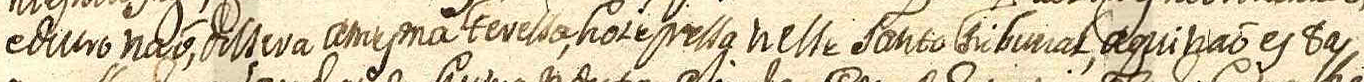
e outro naõ, dissera a mesma Feressa, hoie pressa nesse Santo Tribunal, aqui naõ esta
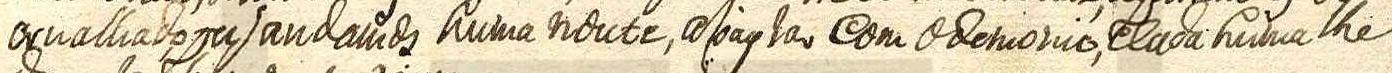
orualhado, porq̄ andamos huma noute, a baylar Com o demonio, E Cada huma lhe
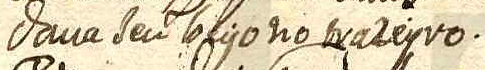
daua seu beijo no trazeyro.
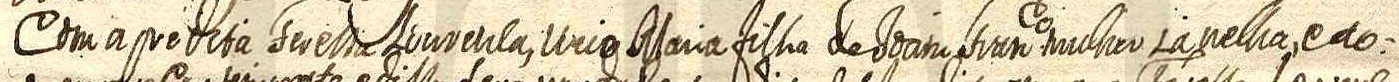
Com a predita Feressa LourenCa, ueio Maria, filha de Ioam Franco. mulher ia uelha, e ao
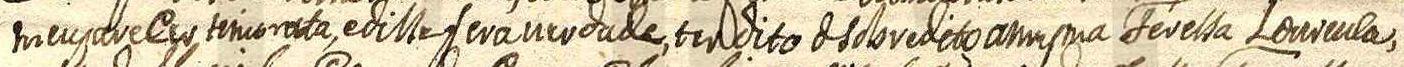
meu pareCer timorata, e disse q̄ era uerdade, ter dito o sobredito a mesma Feressa Lourenca,
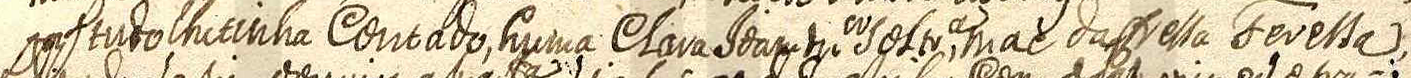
porq̄ tudo lhe tinha Contado, huma Clara Ioam mer soltr,a mae da pressa Feressa,
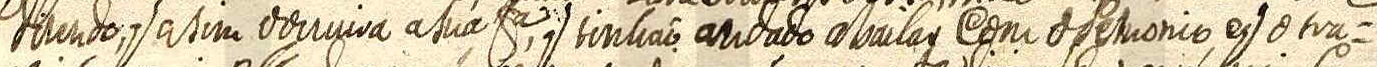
dizendo, q̄ asim o ouuira a sua fa, q̄ tinhaõ andado a bailar Com o Demonio, e q̄ o tra
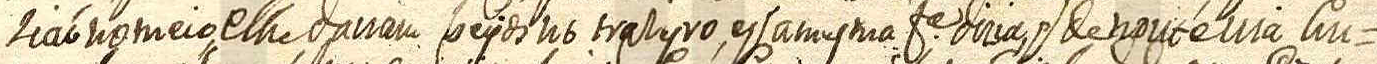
ziaõ no meio e lhe dauam beijos no trasejro, e q̄ a mesma f.a dizia, q̄ de noute uia hu
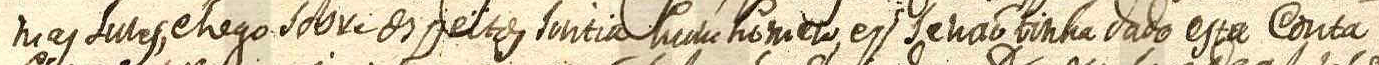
mas Luses, e Logo sobre os peitos sentia hum homem, e q̄ se naõ tinha dado esta Conta
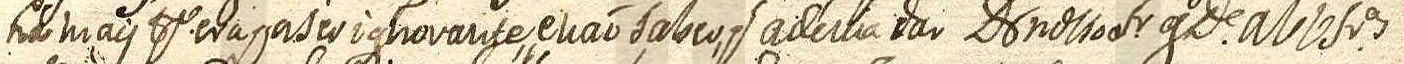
ha mais tpo. era por ser ignorante e naõ saber, q̄ a deuia dar Ds nosso S.r gd.e a VV Sr.as
